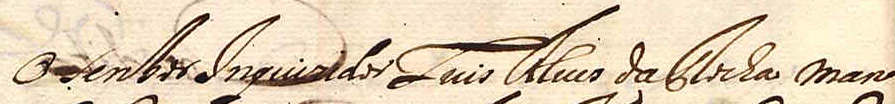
o senhor Inquizidor Luis Alues da Rocha man
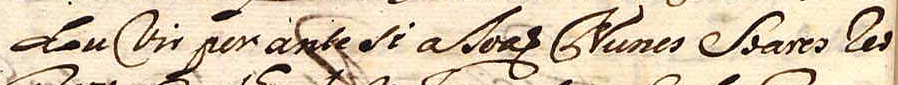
dou vir perante si a Ioão Nunes Soares Reo
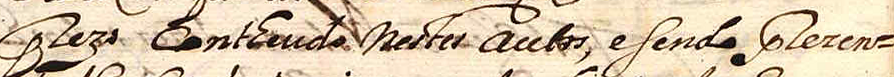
pRezo Contheudo nestes autos, e sendo prezen
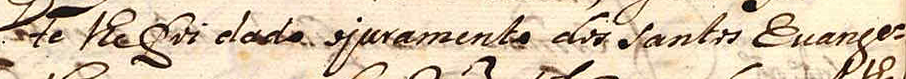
te lhe foi dado o juramento dos santos Euange
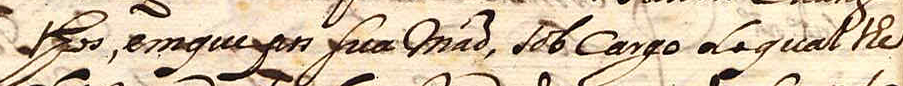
lhos, em que pos sua maõ, sob cargo do qual lhe
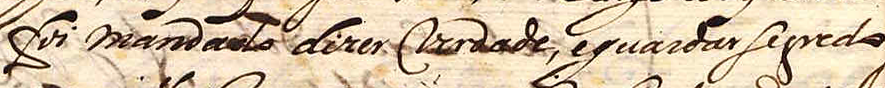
foi mandado dizer verdade, e guardar segredo
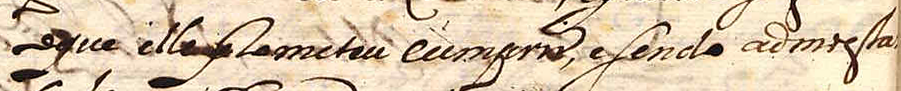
o que elle prometeu cumprir, e sendo admoesta
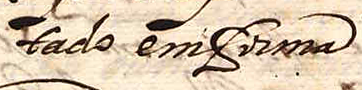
tado em forma
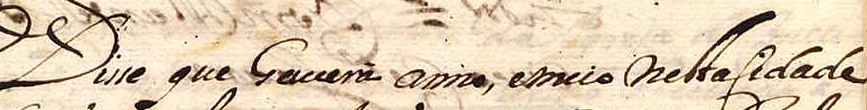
Disse que hauerá anno, e meio nesta Cidade
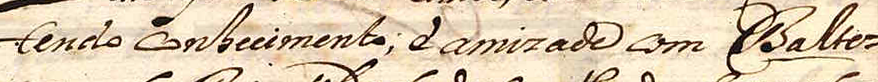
tendo conhecimento; e amizade com Balte
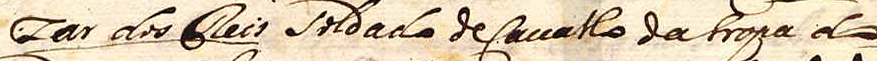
zar dos Reis soldado de Cauallo da tropa do
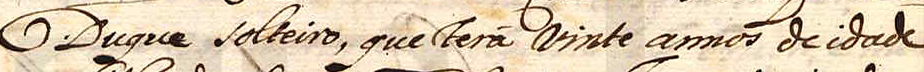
Duque solteiro, que terá vinte annos de idade
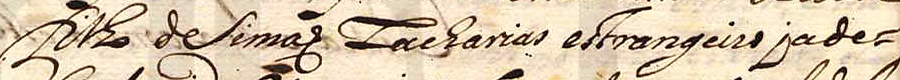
filho de Simaõ Zacharias estrangeiro ja de
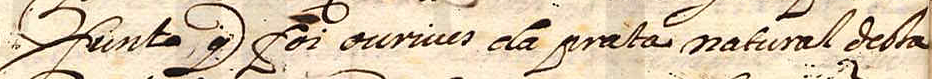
funto, q̄ foi ouriues da prata natural desta
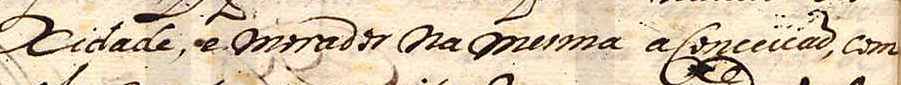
Cidade, e morador na mesma a Conceiçaõ, com
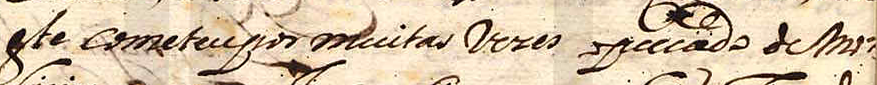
este cometeu por muitas vezes o peccado de mo
